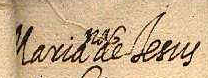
Mariana de Iesus
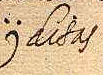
ꝯditas
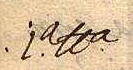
i.a tta.
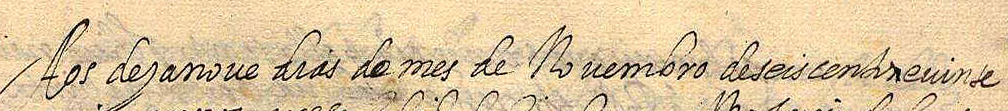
Aos dezanoue dias do mes de Nouembro de seiscentoa e uinte
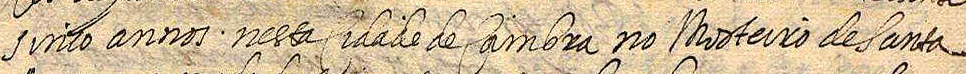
sinco annos nesta Cidade de Coimbra no Mosteiro de Santa
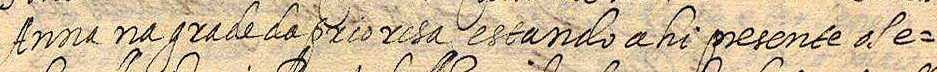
Anna na grade da prioresa estando ahi presente o se
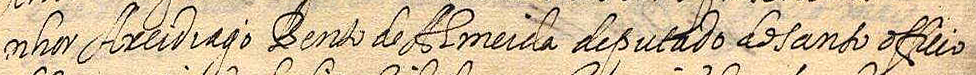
nhor Arcidiago Bento de Almeida deputado do santo officio
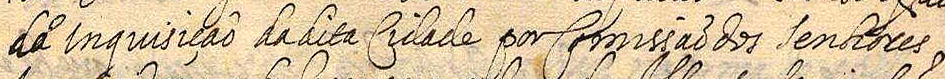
da inquisiçaõ da dita Cidade por Comissaõ dos senhores
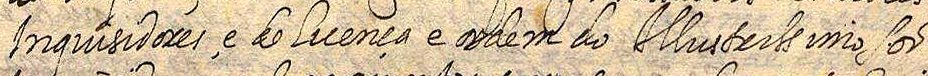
Inquisidores, e de licença, e ordem do Illustrissimo sor̄
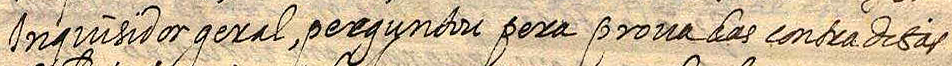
Inquisidor geral, perguntou pera proua das contraditas
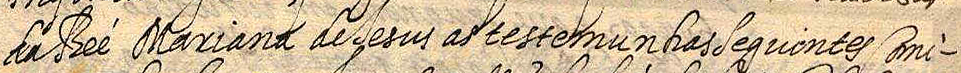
da Reé Mariana de Iesus as testemunhas seguintes Comi
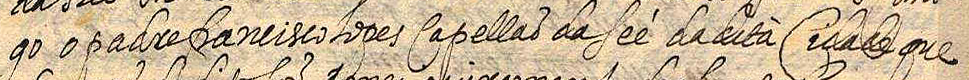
go o padre francisco lopes Capellaõ da seé da dita Cidade que
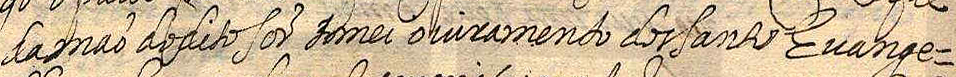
da maõ do dito sor̄ tomei o iuramento dos santos Euange
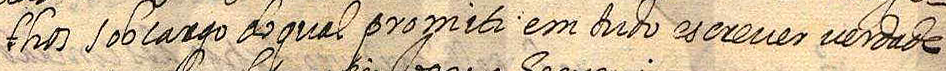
lhos sob cargo do qual promiti em tudo escreuer uerdade
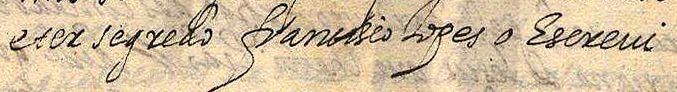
e ter segredo francisco lopes o Escreui
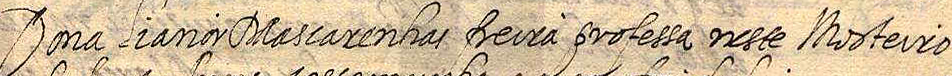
Dona lianor Mascarenhas freira professa neste Mosteiro
